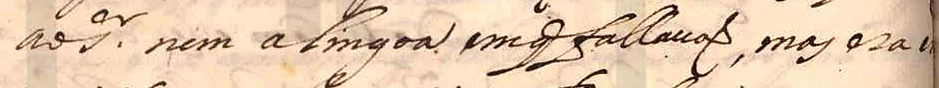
ao s.or nem a lingoa em q̄ fallauaõ, mas era
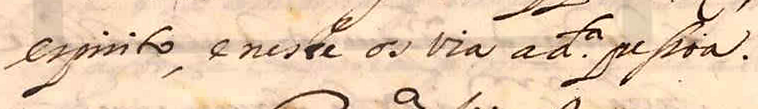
espirito, e neste os via a d̄a pessoa.
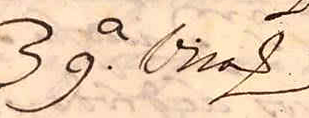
39.a Vizaõ
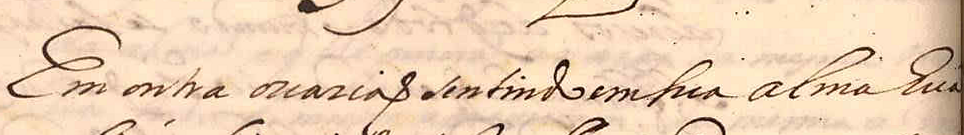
Em outra occaziaõ sentindo em sua alma huā
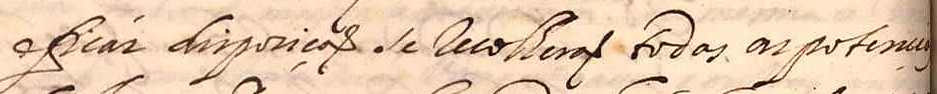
eficaz dispoziçaõ se Recolheraõ todas as potencia
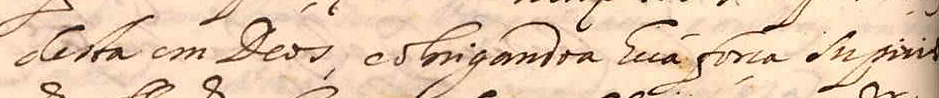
desta em Deos, e obrigandoa huā força supirio
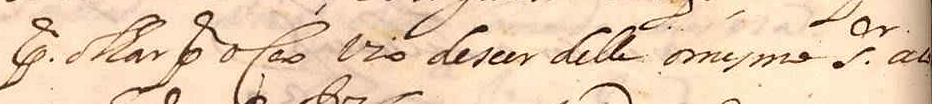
p.a dar p.a o Ceo vio descer delle o mesmo s.or ac
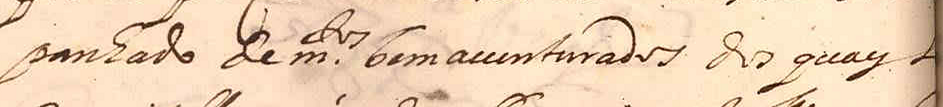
panhado de m.tos bem auenturados dos quaes s
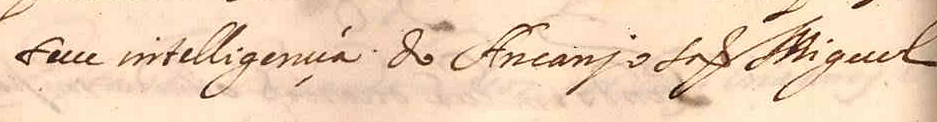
teue intelligencia do Arcanjo saõ Miguel
